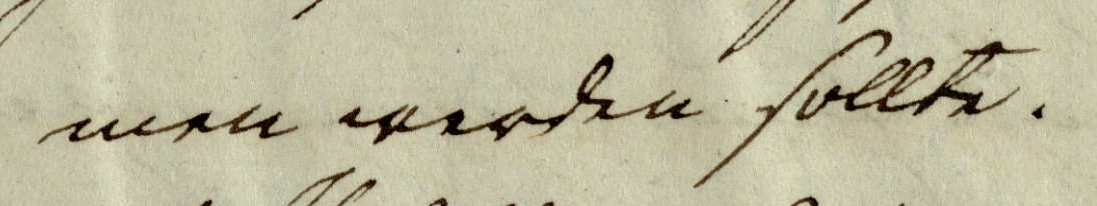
men werden sollte.
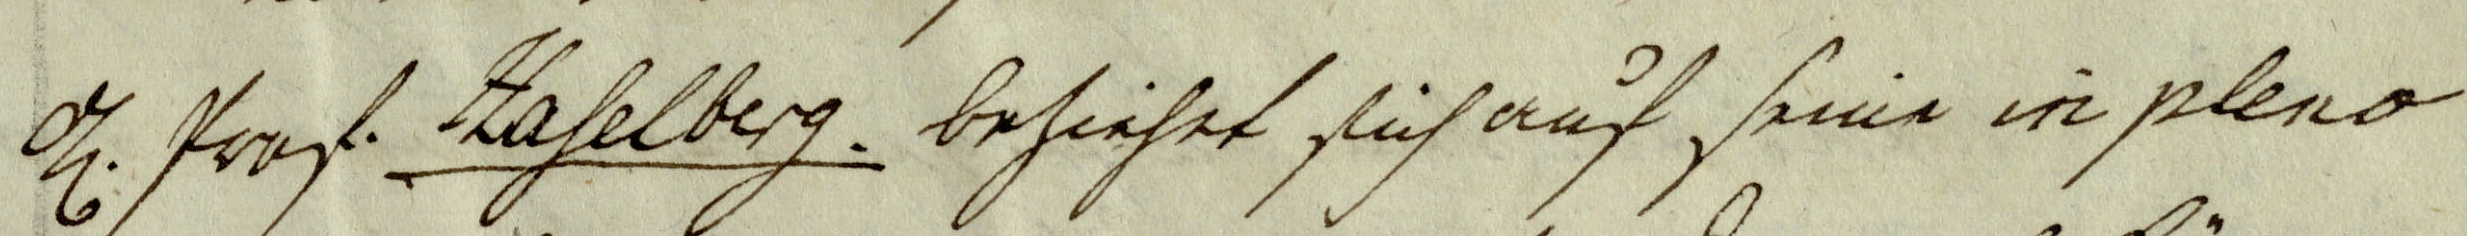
dh. Prof. Haselberg. beziehet sich auf seine in pleno
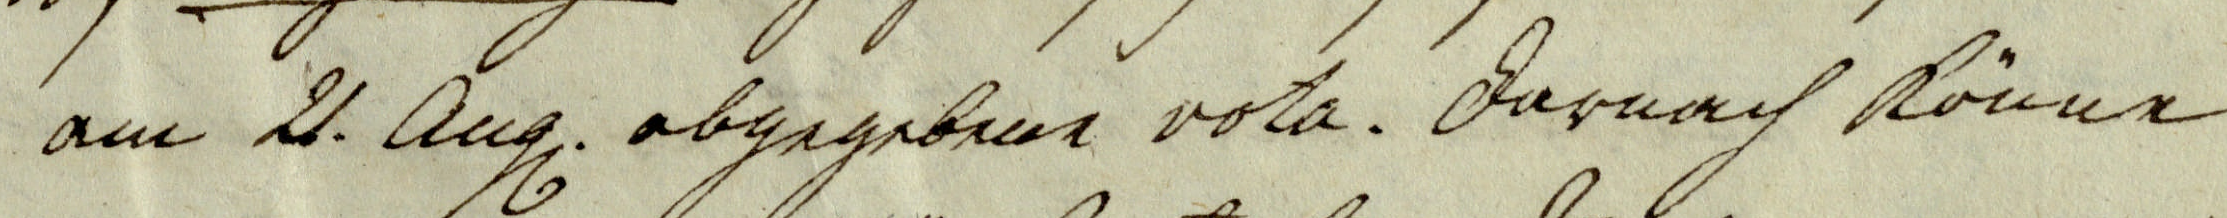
am 21. Aug. abgebene vota. Darnach könne
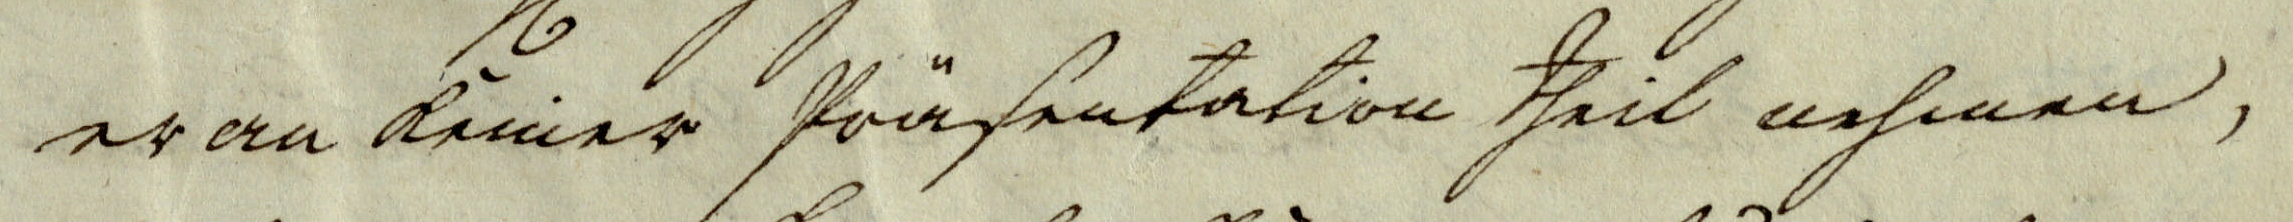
er an keiner Präsentation Theil nehmen,
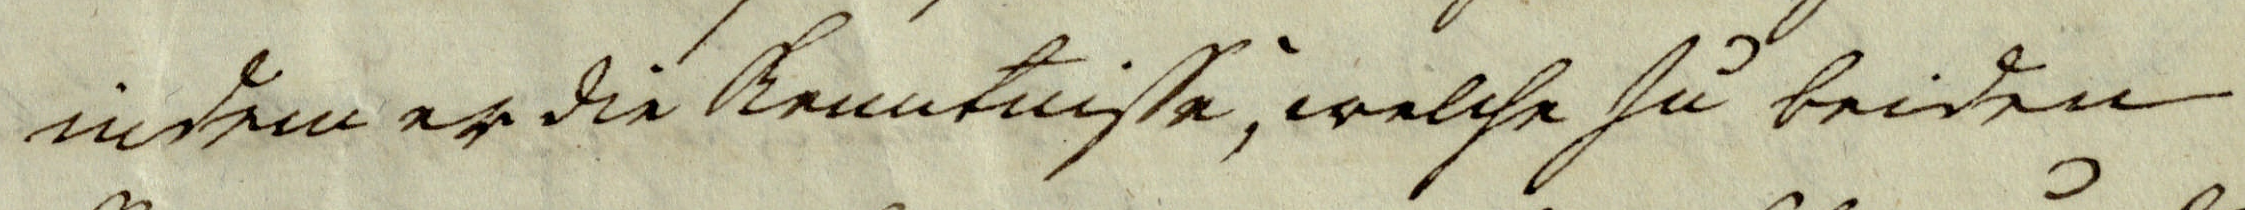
indem er die Kenntnisse, welche zu beiden
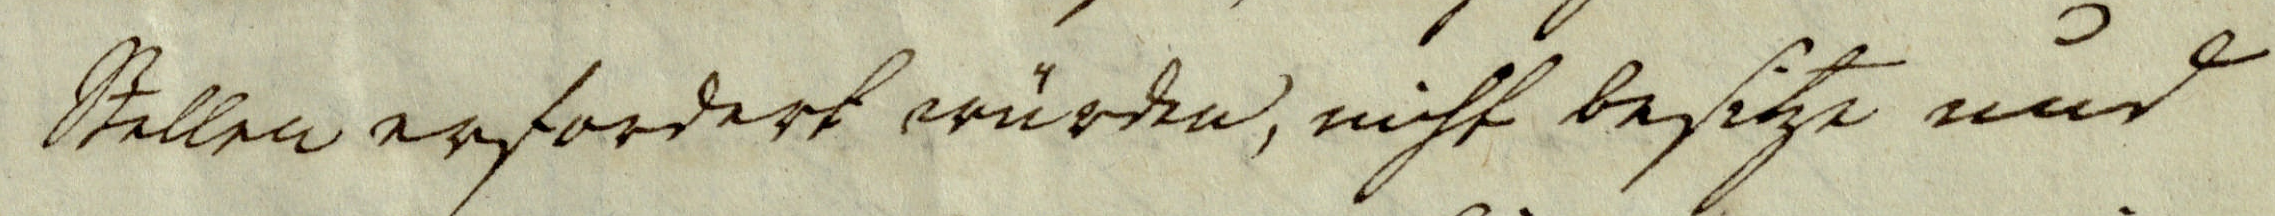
Stellen erfordert würden, nicht besitze und
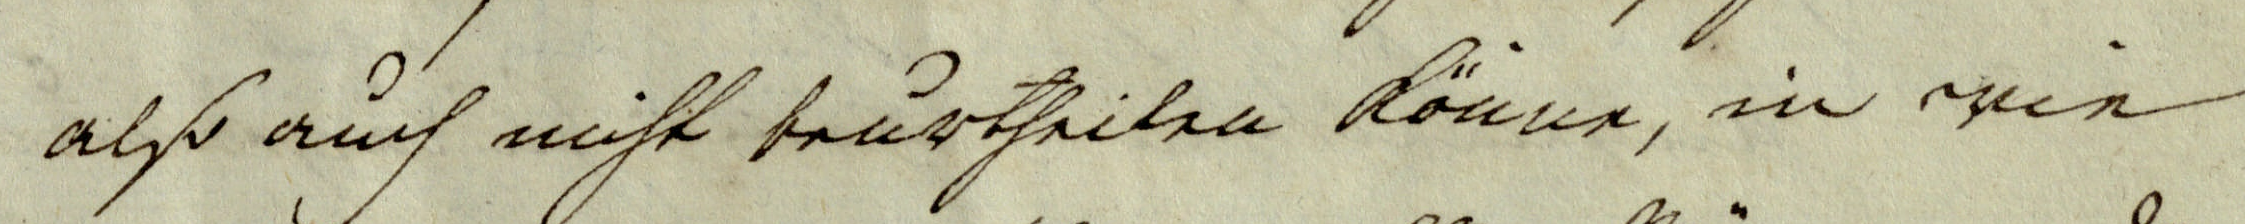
also auch nicht beurtheilen könne, in wie
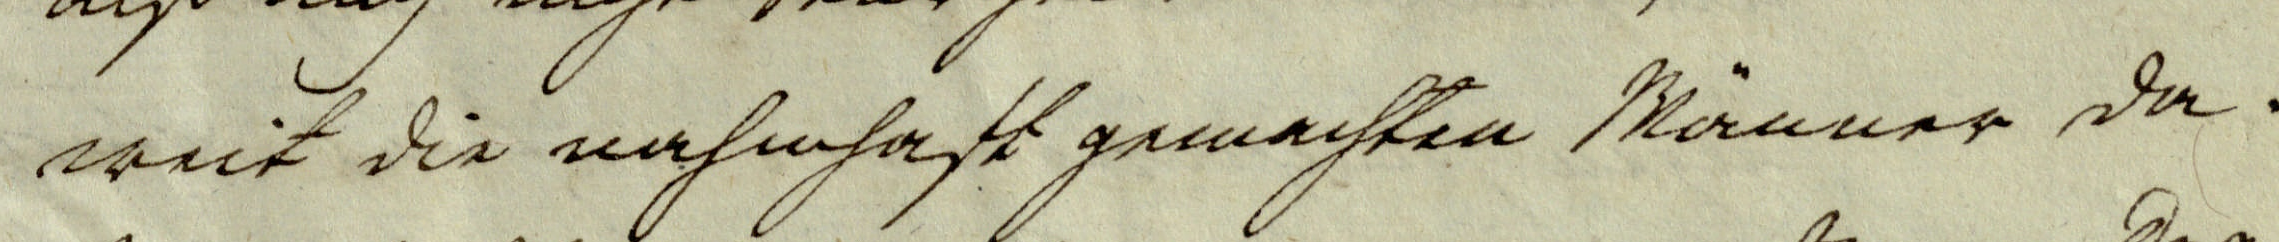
weit die nahmhaft gemachten Männer da
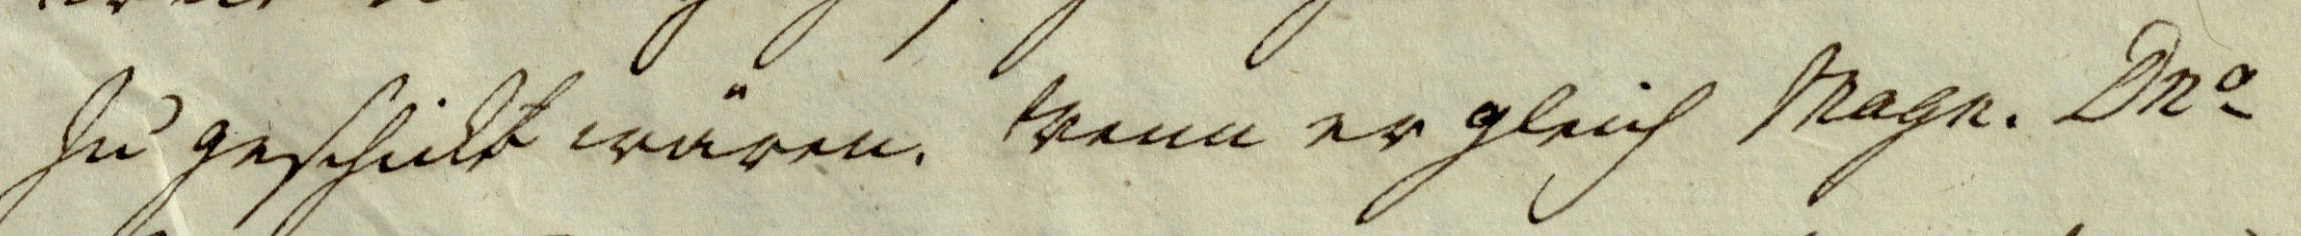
zu geschickt wären. Wenn er gleich Magn. Dno
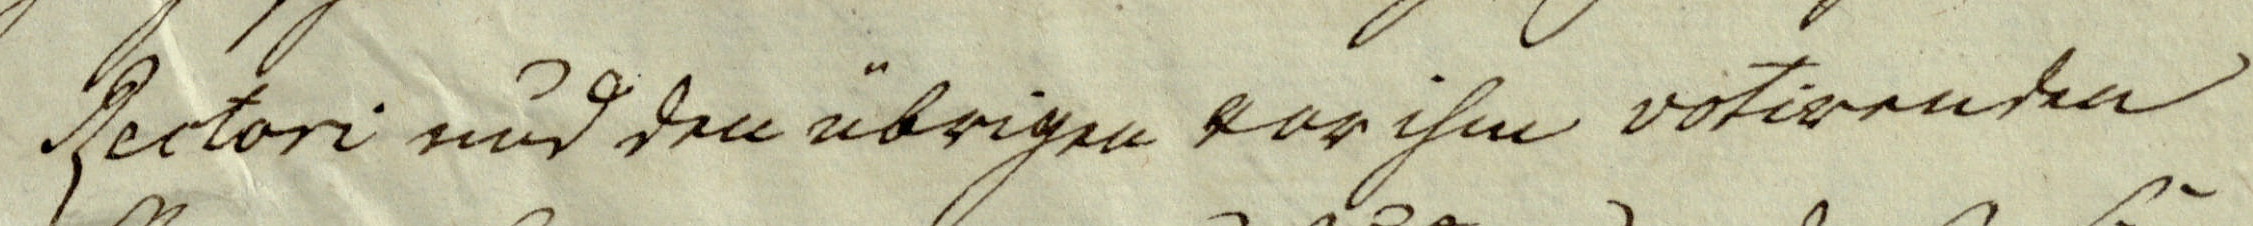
Rectori und den übrigen vor ihm votirenden
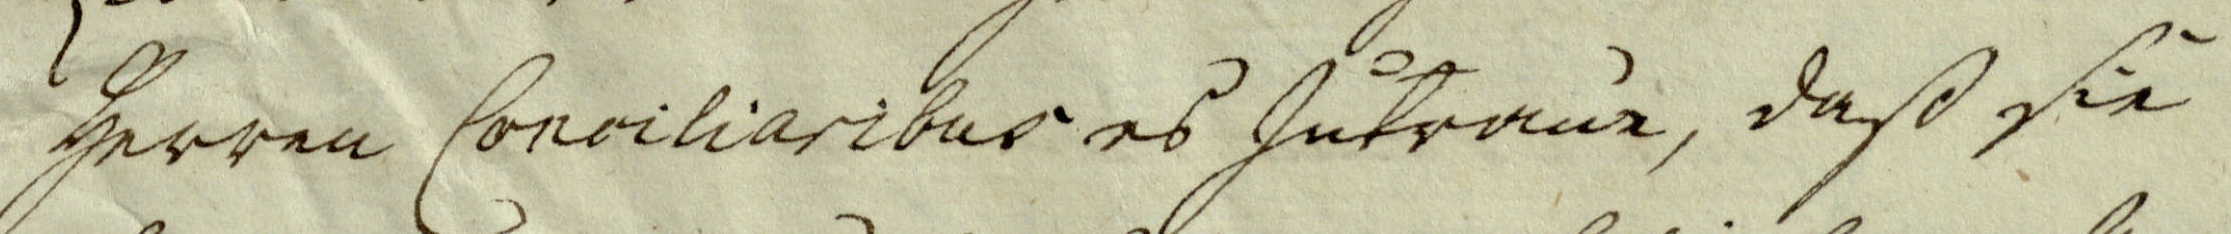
Herren Conciliaribus es zutraue, daß sie
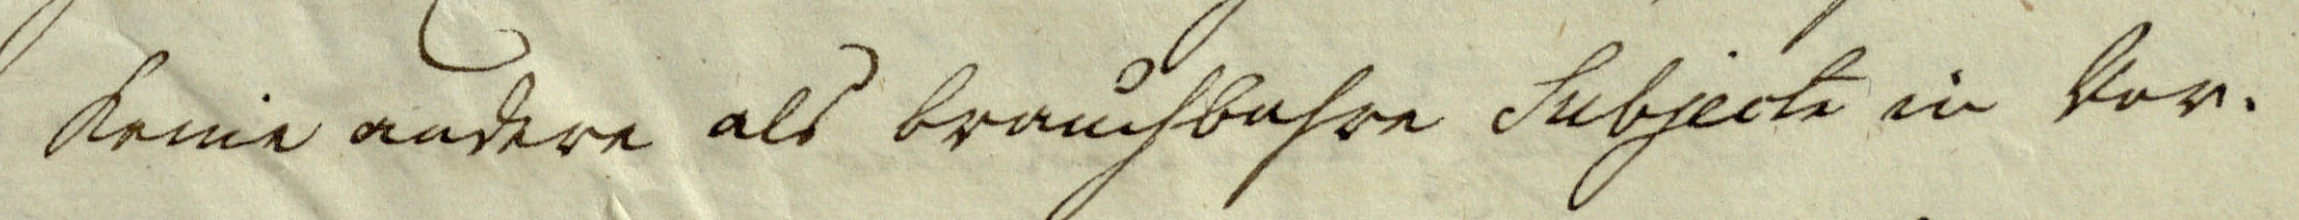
keine andere als brauchbahre Subjecte in Vor¬
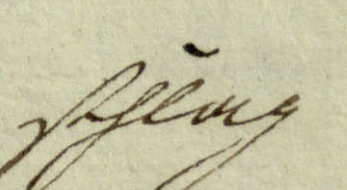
schlag
